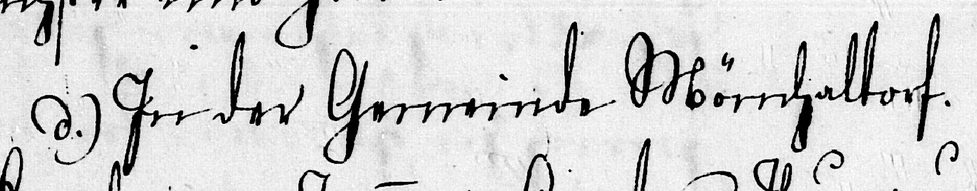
d.) In der Gemeinde Mönchaltorf.
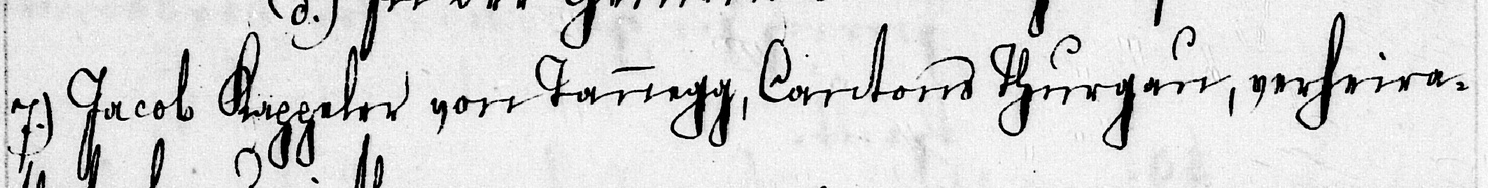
7.) Jacob Kappeler von Tannegg, Cantons Thurgau, verheira¬
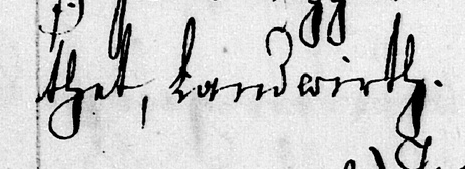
thet, Landwirth.
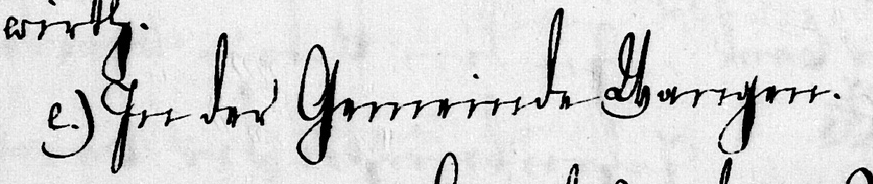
e.) In der Gemeinde Wangen.
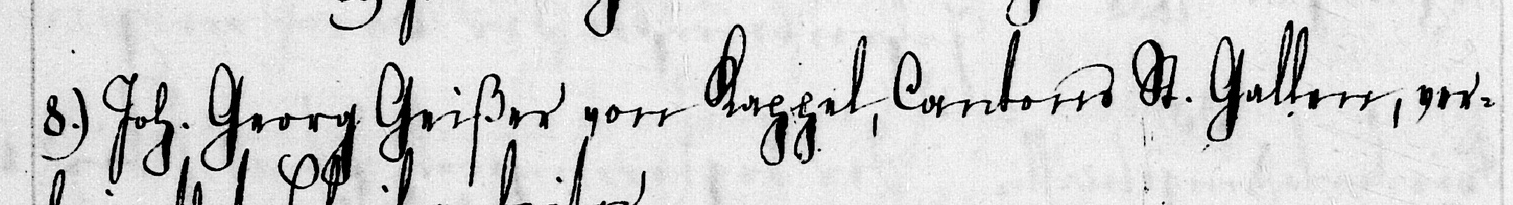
8.) Joh. Georg Geißer von Kappel, Cantons St. Gallen, ver¬
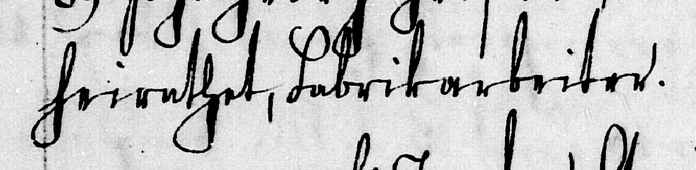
heirathet, Fabrikarbeiter.
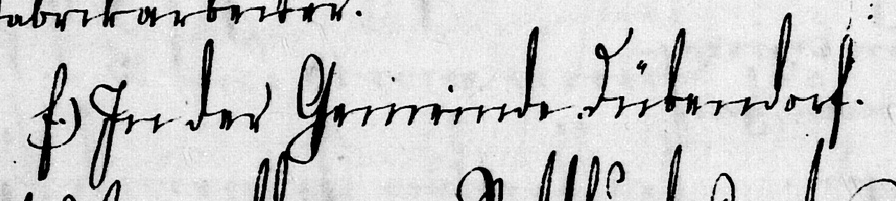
f.) In der Gemeinde Dübendorf.
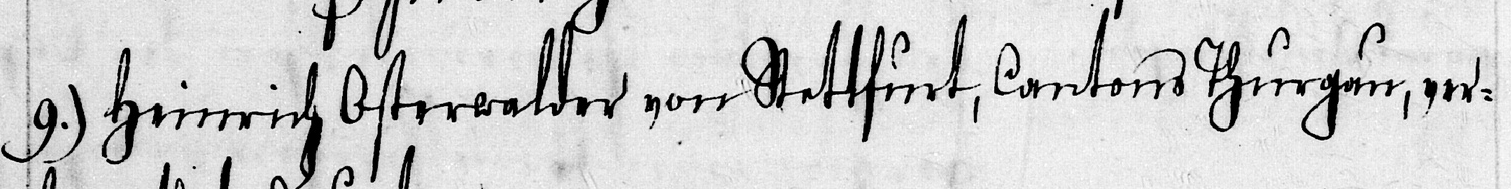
9.) Heinrich Osterwalder von Stettfurt, Cantons Thurgau, ver¬
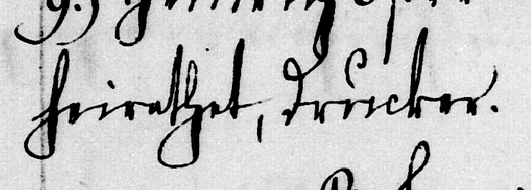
heirathet, Drucker.
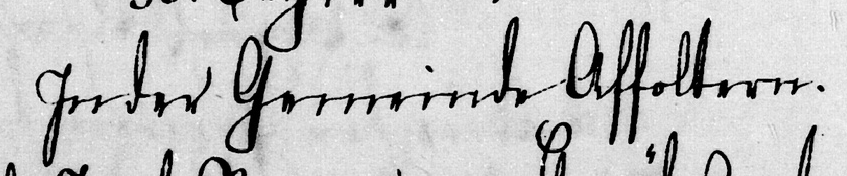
In der Gemeinde Affoltern.
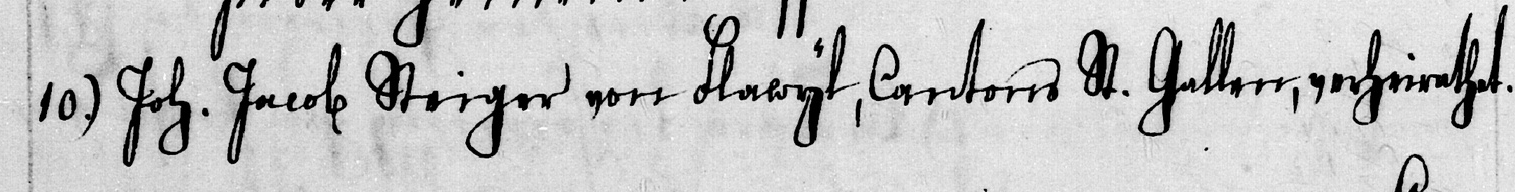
10.) Joh. Jacob Steiger von Flawyl, Cantons St. Gallen, verheirath¬
